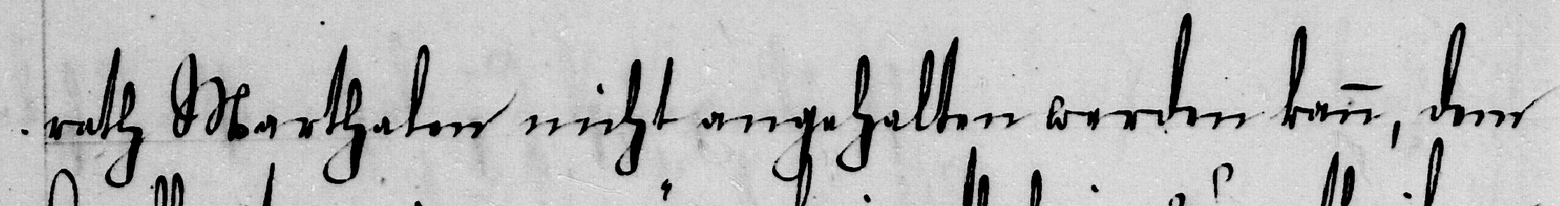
rath Marthalen nicht angehalten werden kann, dem
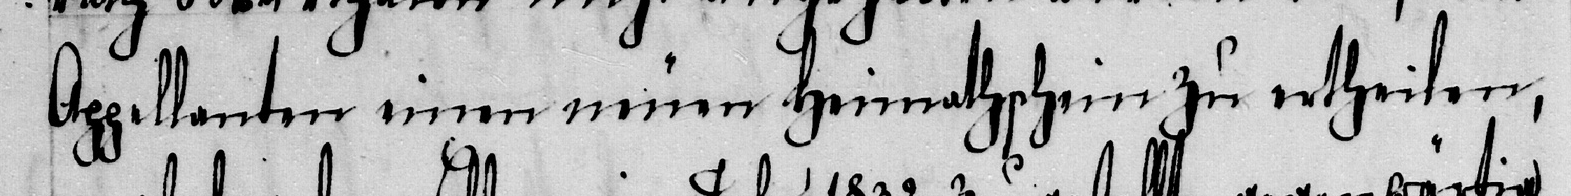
Appellanten einen neuen Heimathschein zu ertheilen,
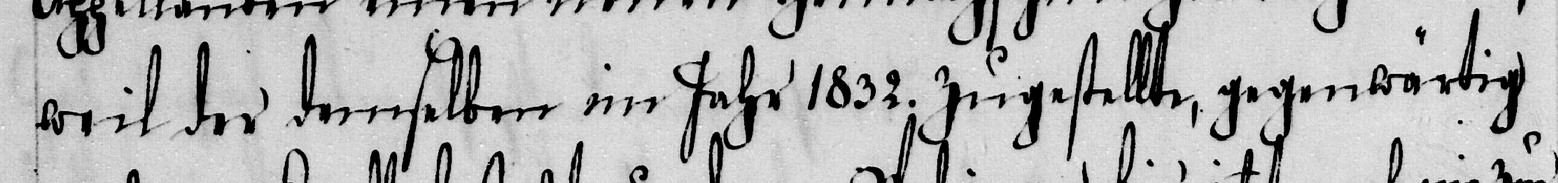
weil der demselben im Jahr 1832. zugestellte, gegenwärtig
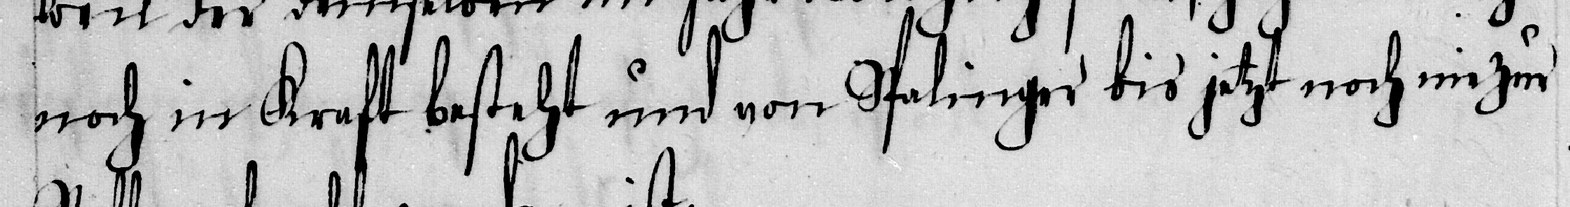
noch in Kraft besteht und von Spalinger bis jetzt noch nie zur
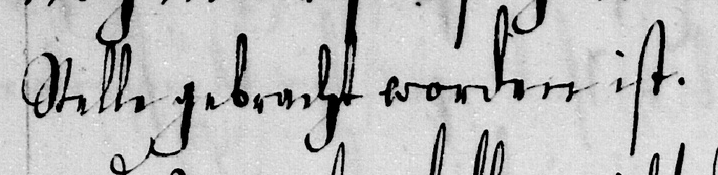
Stelle gebracht worden ist.
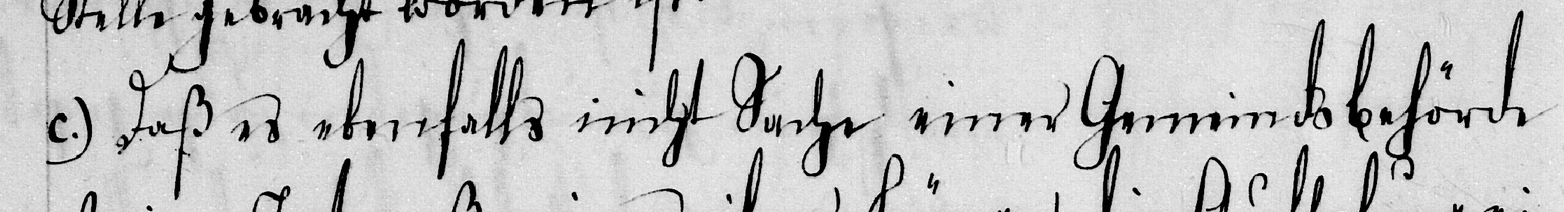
c.) Daß es ebenfalls nicht Sache einer Gemeindsbehörde
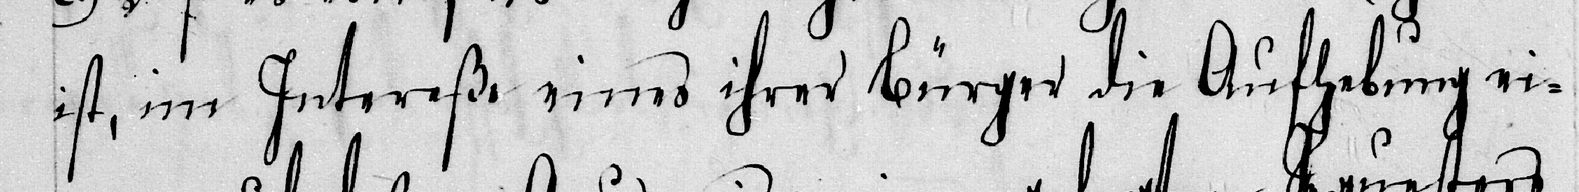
ist, im Intereße eines ihrer Bürger die Aufhebung ei¬
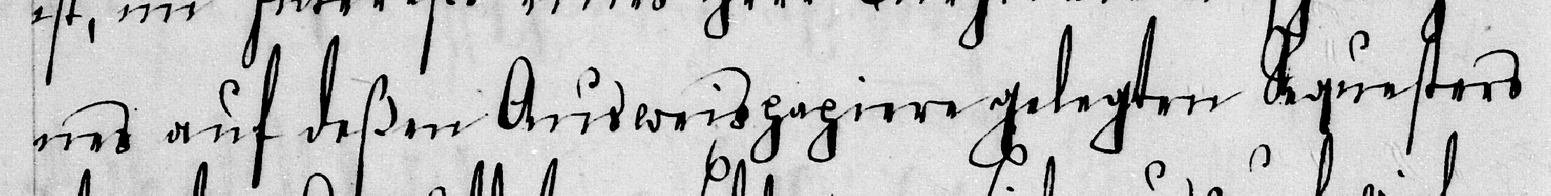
nes auf deßen Ausweispapiren gelegten Sequesters
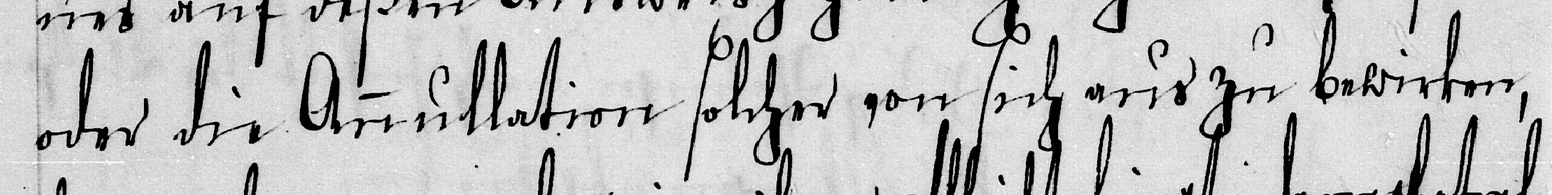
oder die Annullation solcher von sich aus zu bewirken,
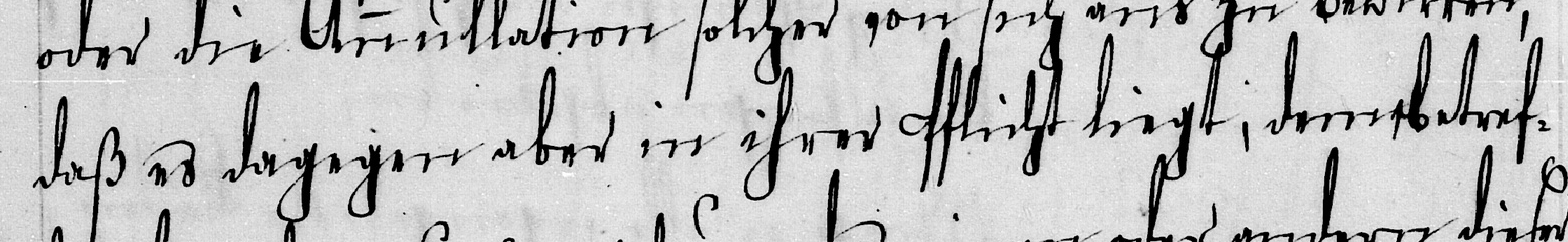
daß es dagegen aber in ihrer Pflicht liegt, dem betref¬
